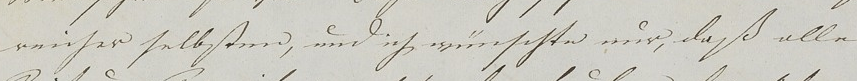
reicher selbsten, und ich wünschte nur, daß alle
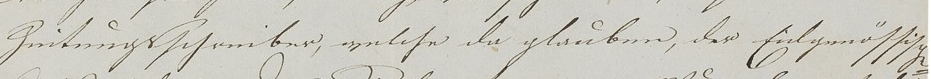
Zeitungsschreiber, welche da glauben, der Eidgenössische
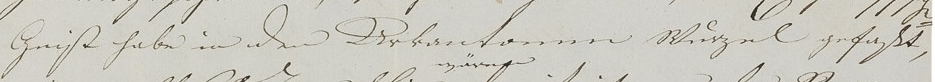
Geist habe in den Urkantonen Wurzel gefasst,
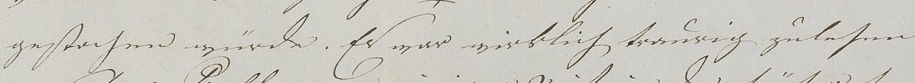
gestochen würde. Es war wirklich traurig zulesen
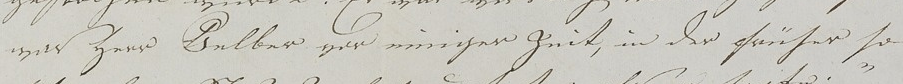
was Herr Felber vor einiger Zeit, in der früher so
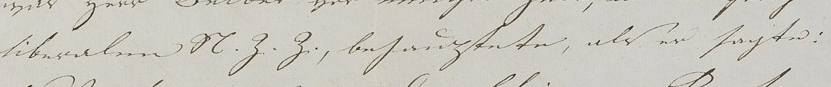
liberalen N.Z.Z., behauptete, als er sagte: «
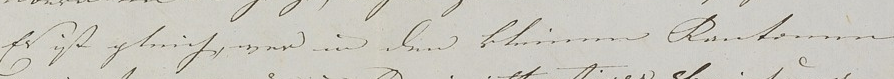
Es ist gleich, wer in den kleinen Kantonen
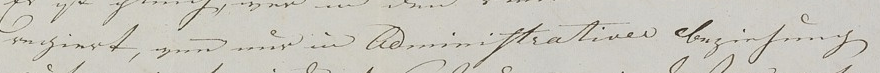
regiert, wenn nur in Administrativer Beziehung
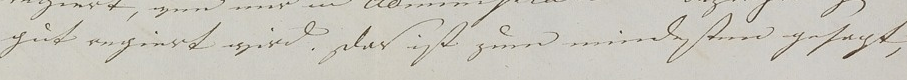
gut regiert wird.» Das ist zum mindesten gesagt,
